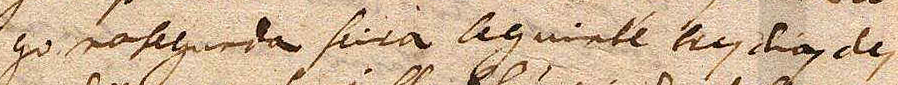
go na segunda feira seguinte tres dias des
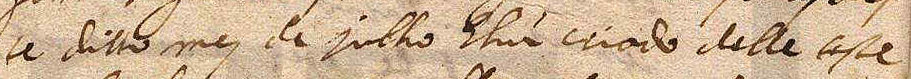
te ditto mes de julho E hū criado delle teste
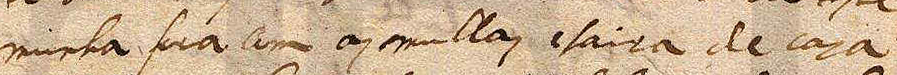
munha fora com as mullas e saira de caza
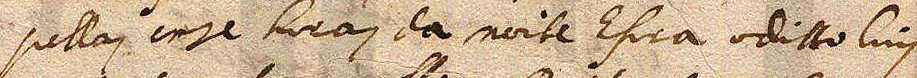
pellas onze horas da noite E fora o ditto luis
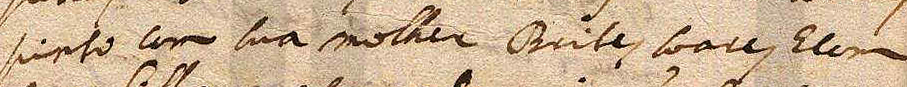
pinho com sua molher Brites soares E com
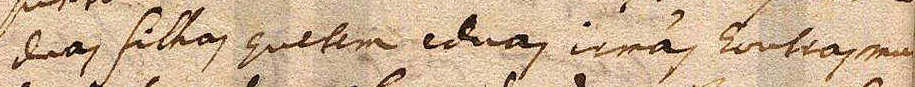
duas filhas que tem e duas irmãs E outras mu
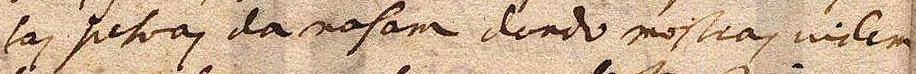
tas pesoas da nasam dando mostras uidem
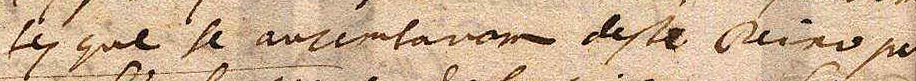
tes que se auzemtauam deste Reino po
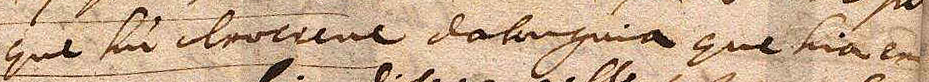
que hū almocreue datouguia que hia em
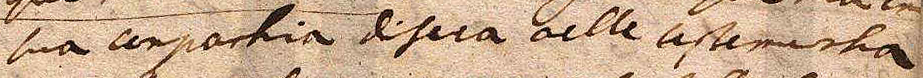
sua companhia disera a elle testemunha
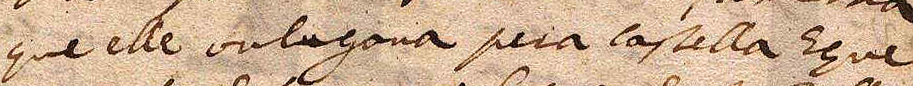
que elle o alugaua pera castella E que
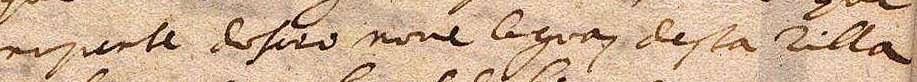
na ponte do soro noue legoas desta villa
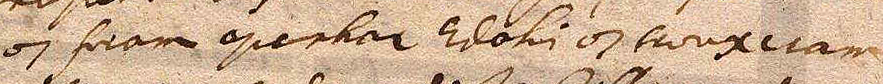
os foram apanhar E dahi os trouxeram
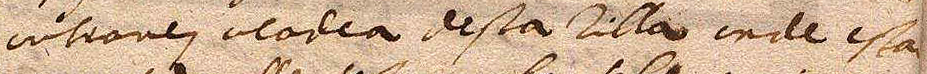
outra ues a cadea desta villa onde esta
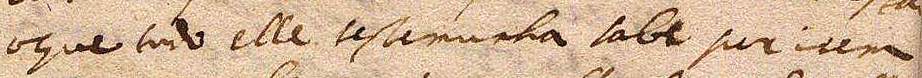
o que tudo elle testemunha sabe por irem
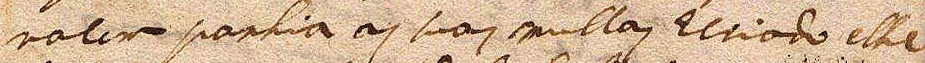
na companhia as suas mullas E criado e lhe
